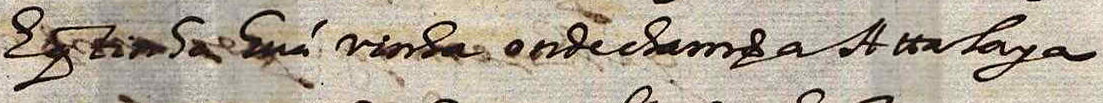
E q̄ tinha huā vinha onde chamão a Attalaya
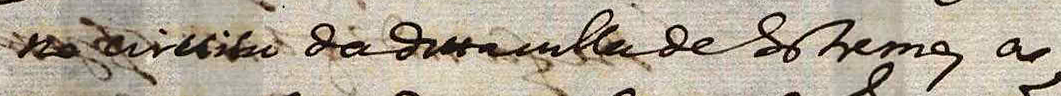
no circuitu da dita uilla de Estremos a
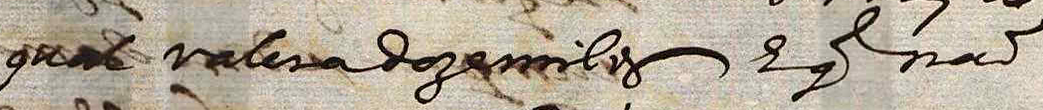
qual valera doze mil rs E q̄ naõ
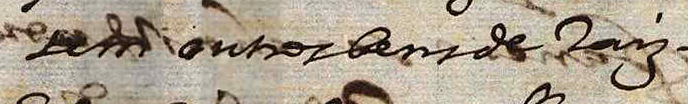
tem outros bens de Raiz
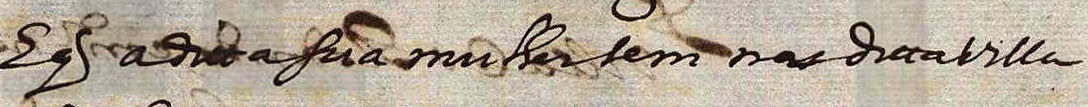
E q̄ a dita sua mulher tem nas ditta villa
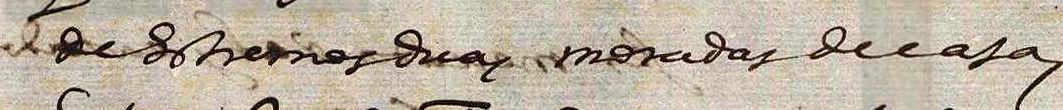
de Estremos duas moradas de casas
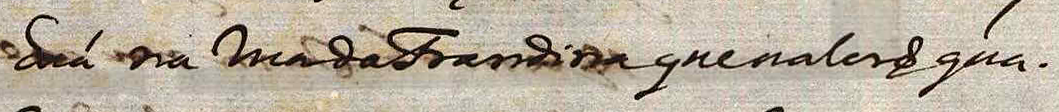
huā na Rua da Frandina que ualerão qua
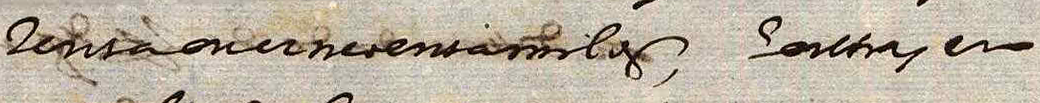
renta ou cincoenta mil rs, E outras em
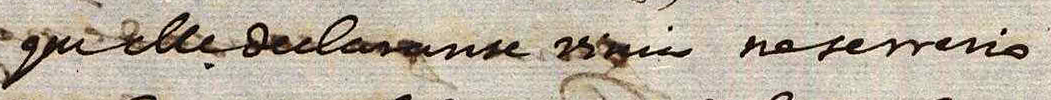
que elle declarante viuia no terreiro
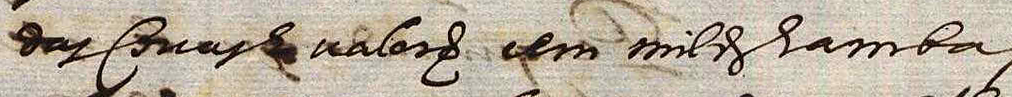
das Couas E ualerão cem mil rs E ambas
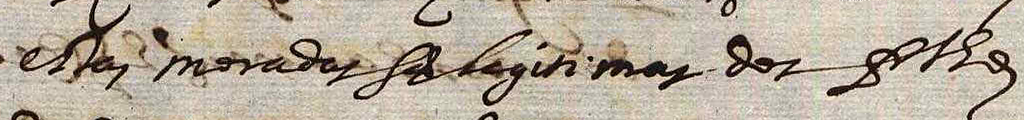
estas moradas são legitimas dos filhos
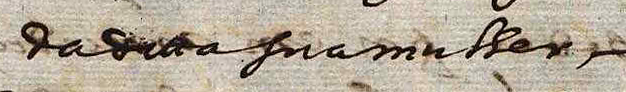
da ditta sua mulher
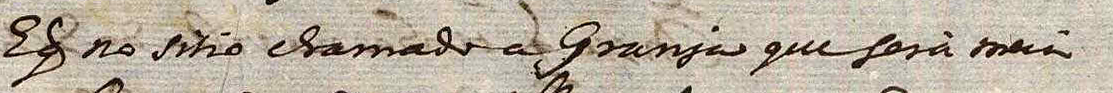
E q̄ no sitio chamado a Granja que serà meia
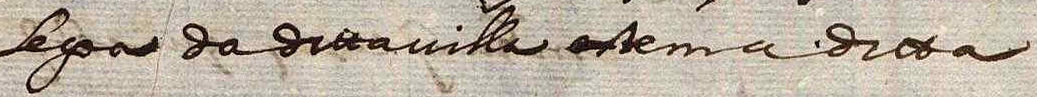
Legoa da ditta uilla estem a ditta
